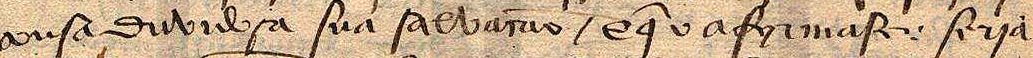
cousa duvidosa sua salvacão / e q̄ o afyrmase : serja
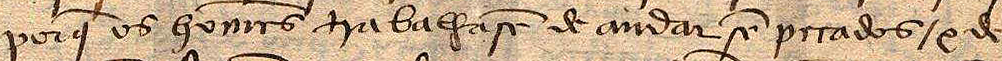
porq̄ os hōmes trabalhas̄e de andar s̄e pecados / e de
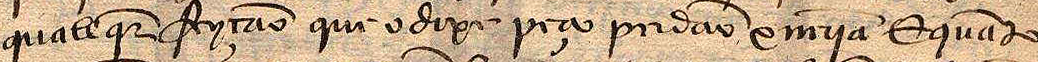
quallq̄r feyção que o dixe peço perdão e mr̄ja E qūato
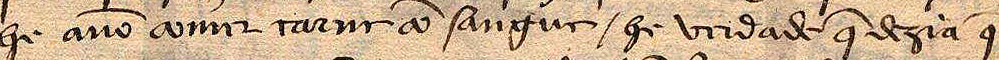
he a n̄o comer carne c̄o sangue / he verdade q̄ dezia q̄
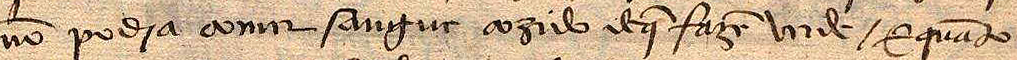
n̄o podja comer sangue cozido de q̄ fazē verde / E qūato
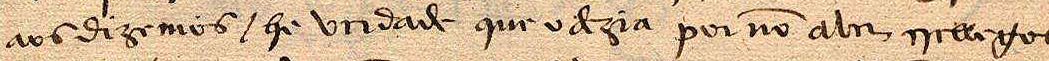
aos dizemos / he verdade que o dezia por n̄o aver crellegos
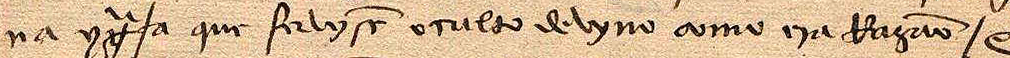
na yḡJa que servys̄e o culto devyno como era Razão / e
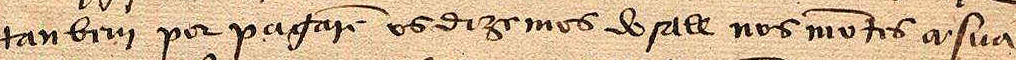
tanbem por pagar̄e os dizemos do sall nos m̄otes a sua
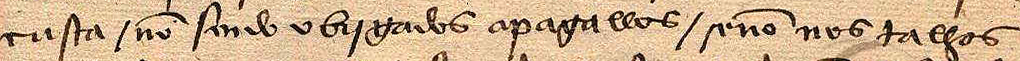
custa / n̄o sendo obrjgados a pagallos / sen̄o nos talhos
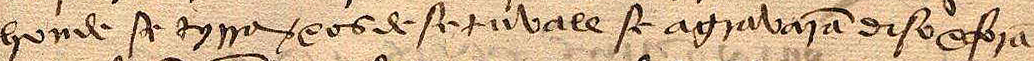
honde se tyrra / e os de setuvall se agravar̄a diso e fora
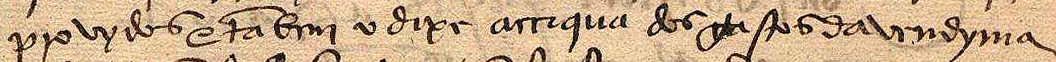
provydos e t̄abem o dixe acerqua dos gastos da vendyma
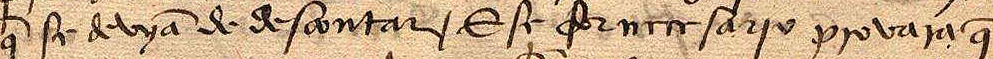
q̄ se devyā de descontar / E se for necesarjo provara q̄
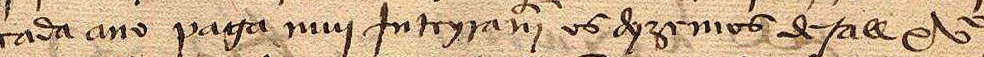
cada ano paga muj Jnteyramte os dyzemos de sall e vo
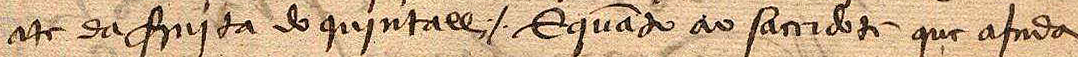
ate da frujta do qujntall ./. E qūato ao sacerdote que aJnda
